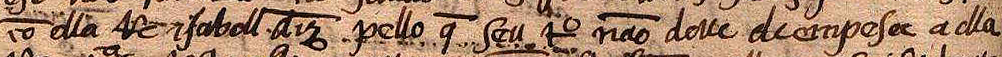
c̄o ella Re isabell d̄iz pello q̄ seu to não deue de empeser a ella
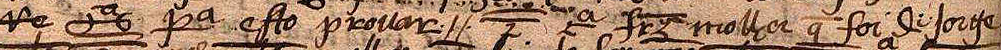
Re tas ꝑa esto prouar .//. item ca fr̄z molher q̄ foi de Jorge
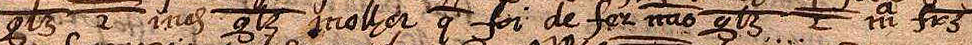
ḡlz item ines ḡlz molher q̄ foi de fernão ḡlz item ma fr̄z
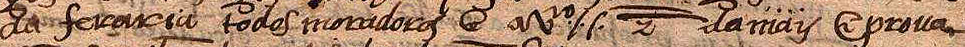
da feraria todos moradores ē avro././. item da mais ē proua
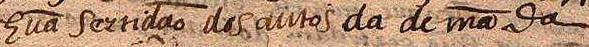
hūa sertidão dos autos da dem̄ada
